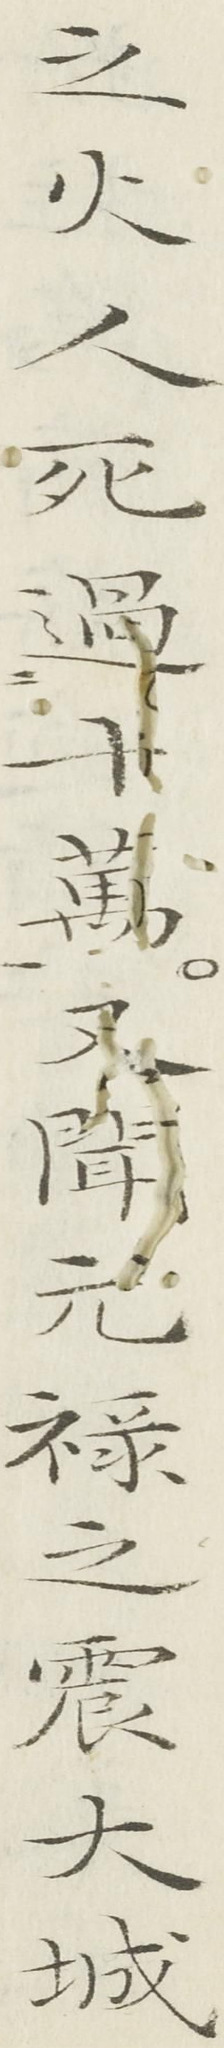之火人死過十万又聞元禄之震之震大城
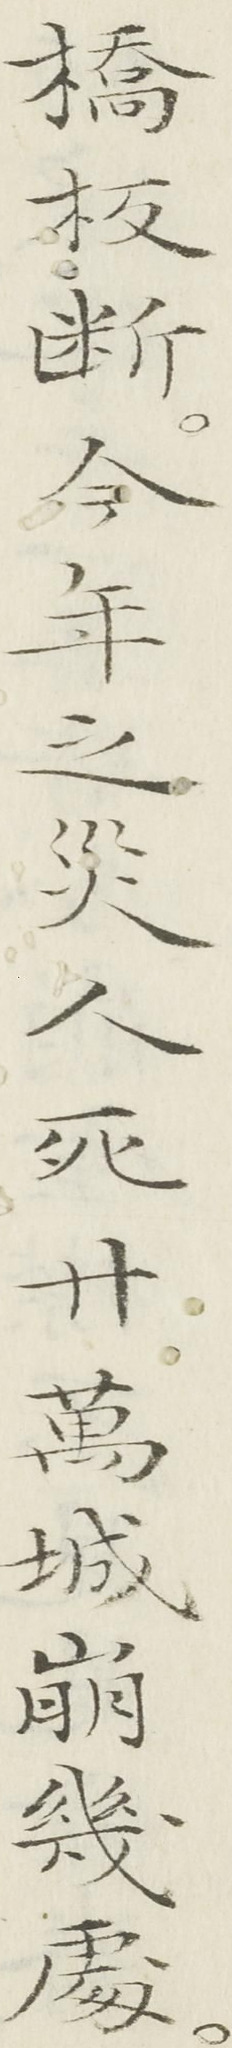橋板断今年之災人死廿万城崩幾処
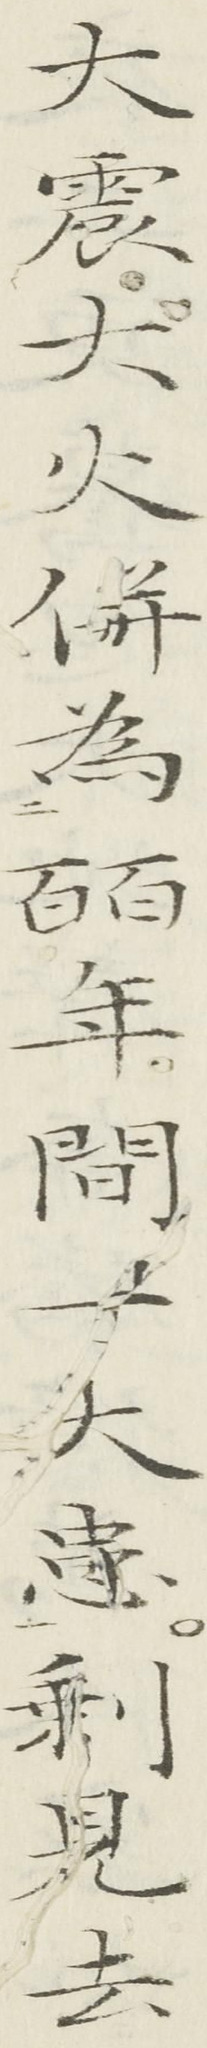大震大火併為皕年間十大患剰見去
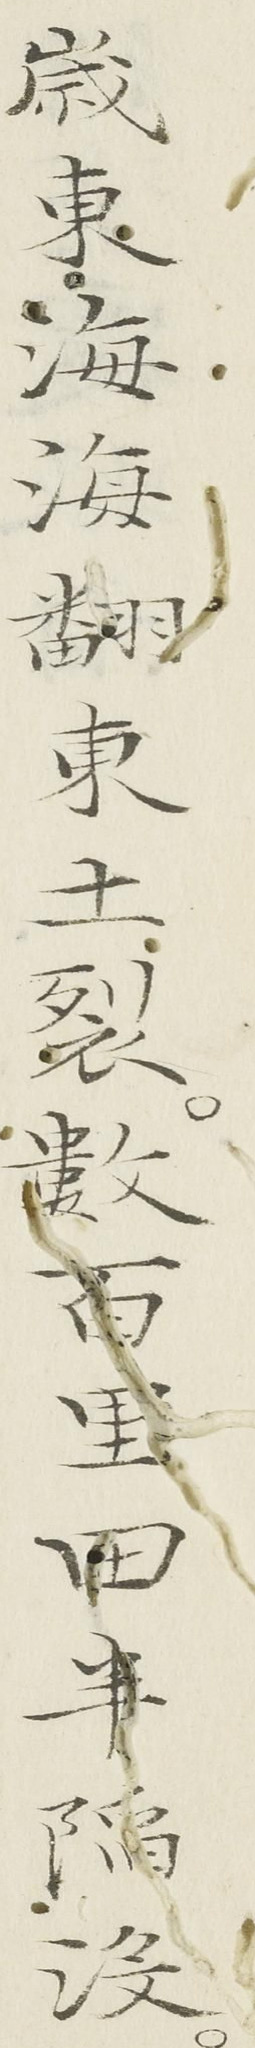歳東海海翻東土裂数百里田半陥没
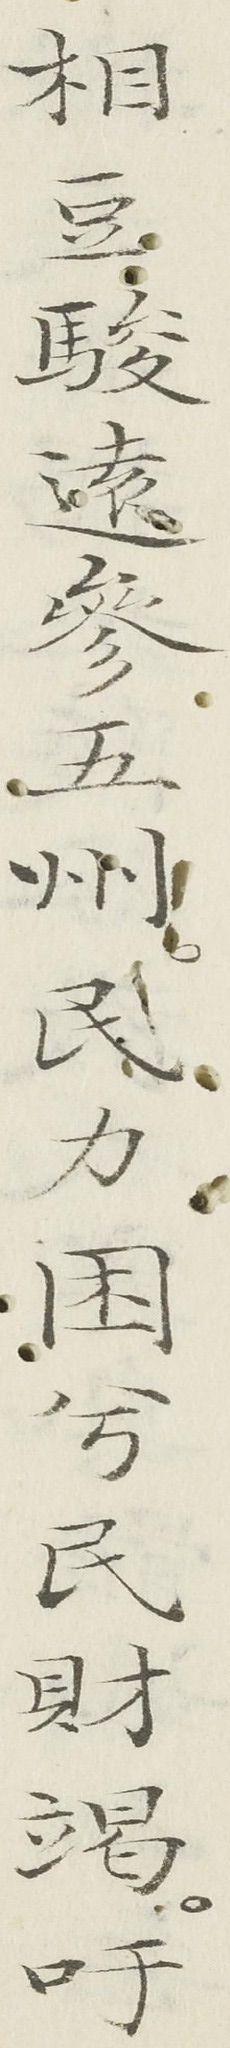相豆駿遠参五州民力国兮民財竭吁
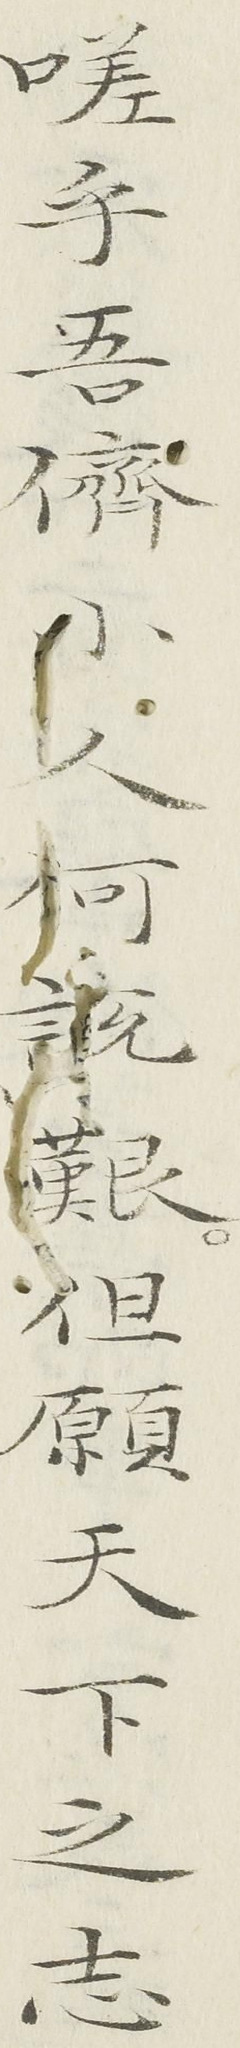嗟乎吾儕小人詵艱但願天下之志
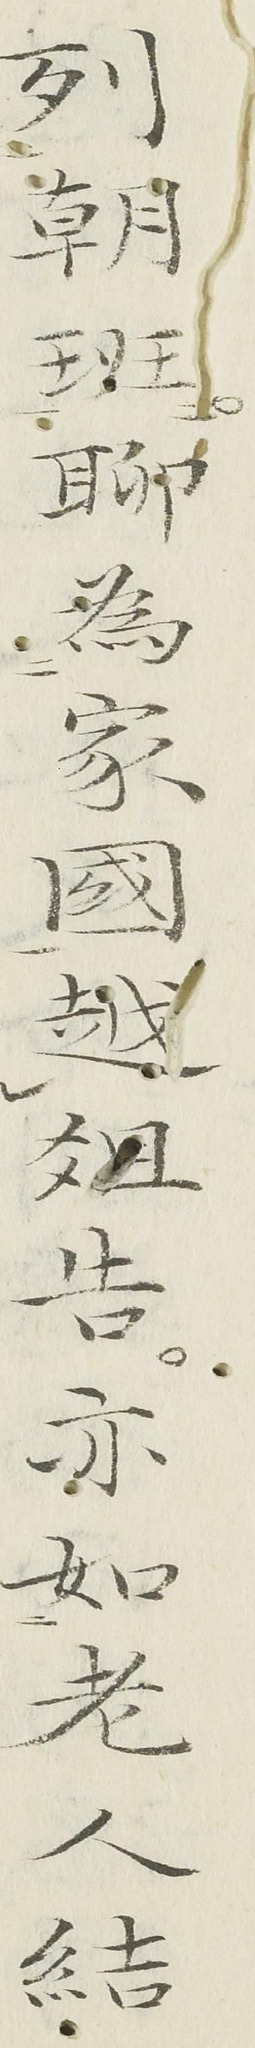列朝班聊為国家越俎告亦如老人結
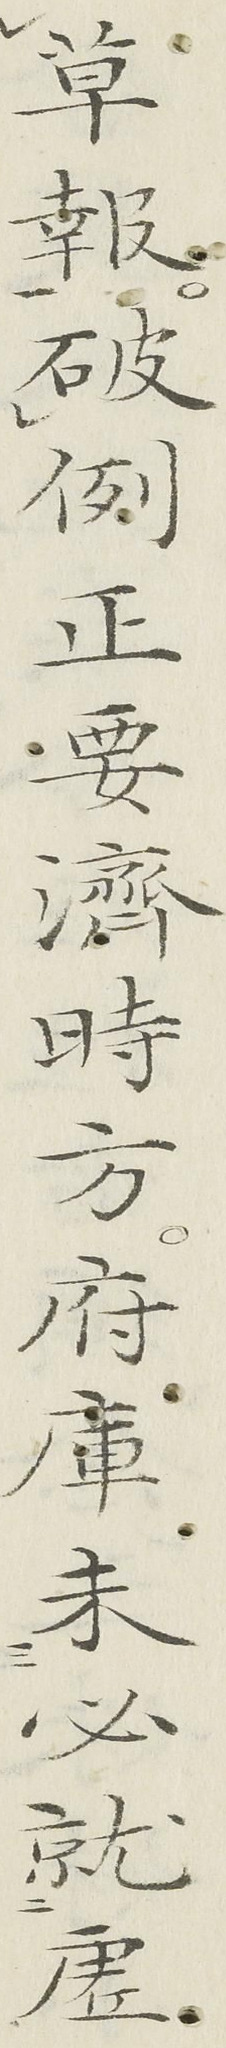草報破例正要済時方府庫未秘必就虗
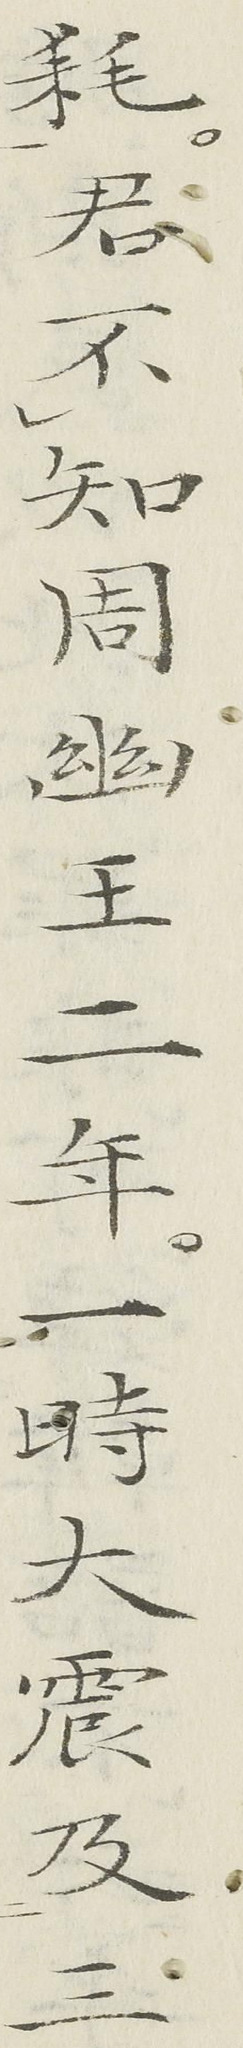耗君不知周幽王二年一時大震及三
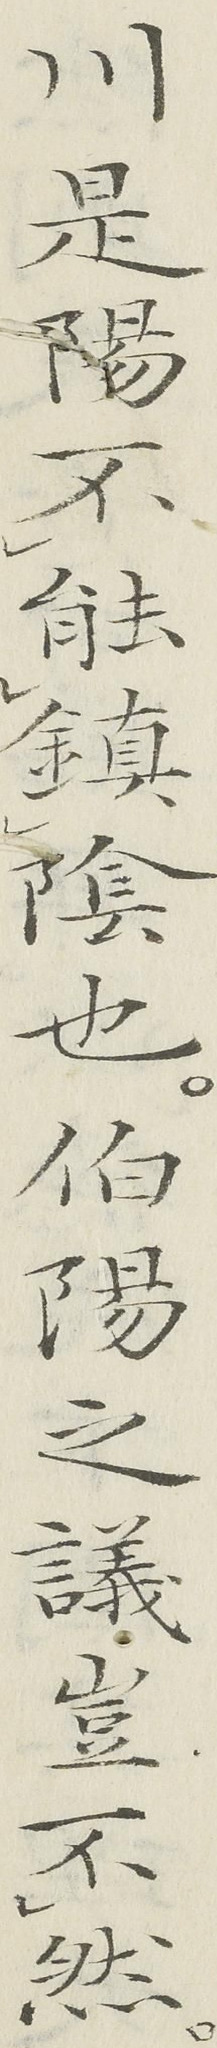川是陽不能鎮陰也拝伯陽之議豈不然

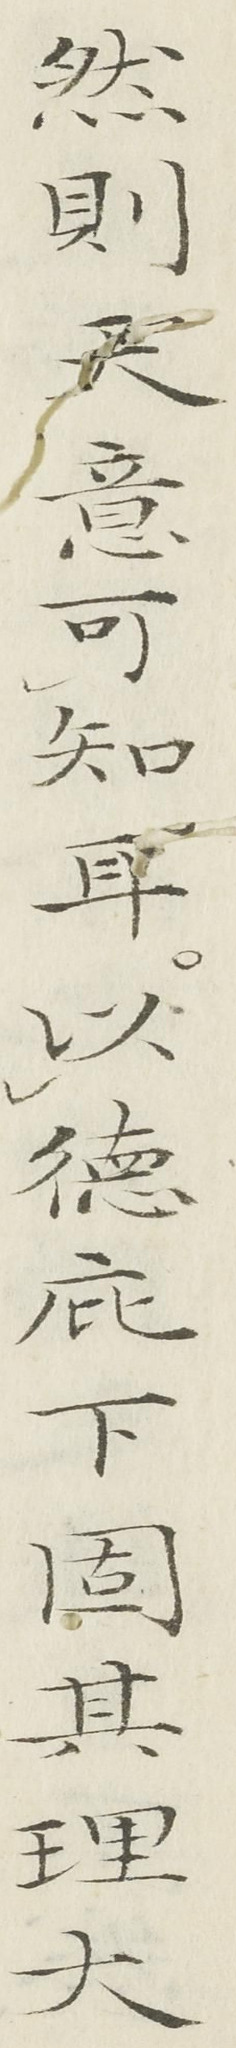然則天意可知耳以徳庇下固其理大
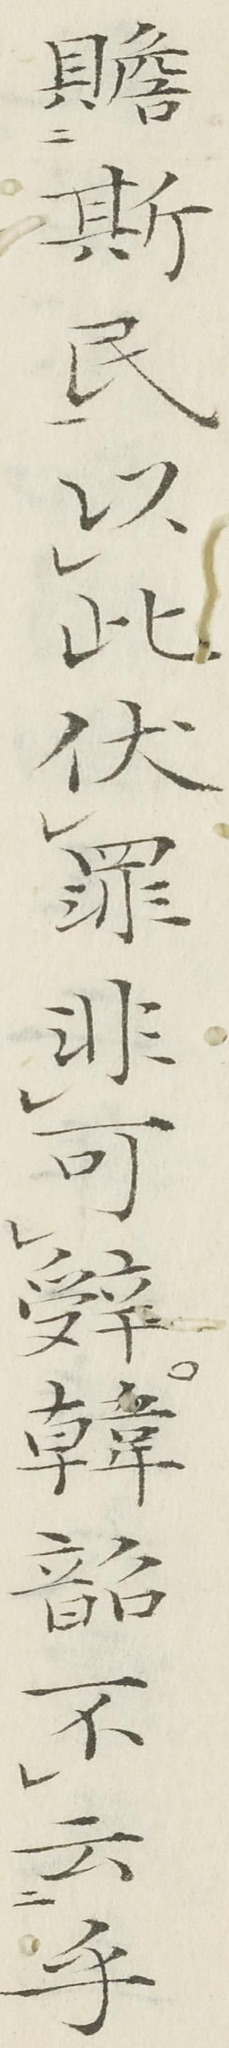贍斯民以此伏罪非可辤韓韶不云乎
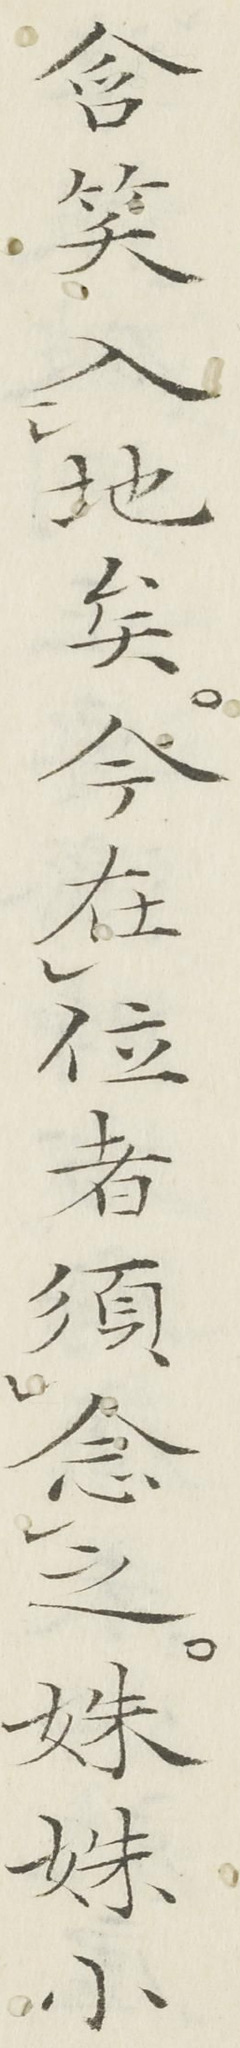含笑入地矣今在位者須念之姝姝小
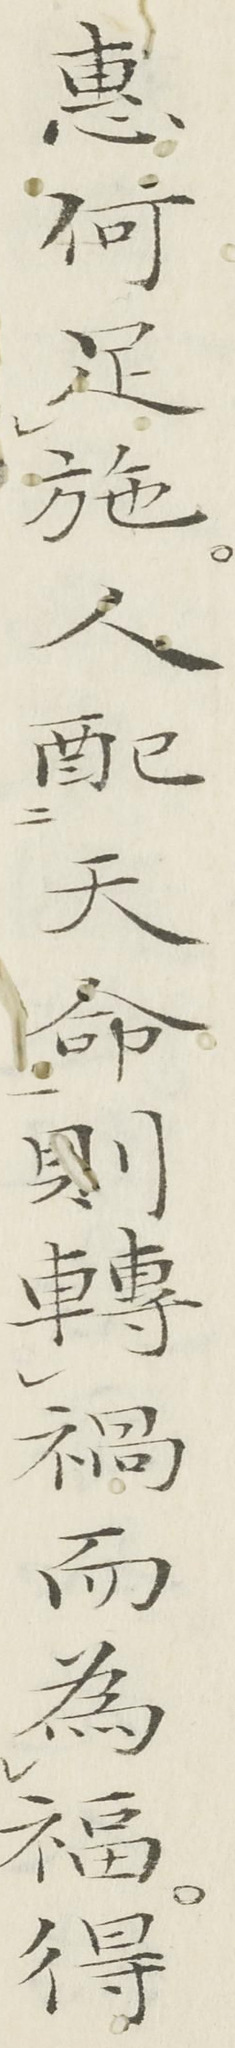恵何足施人晴配天命転禍而為福得
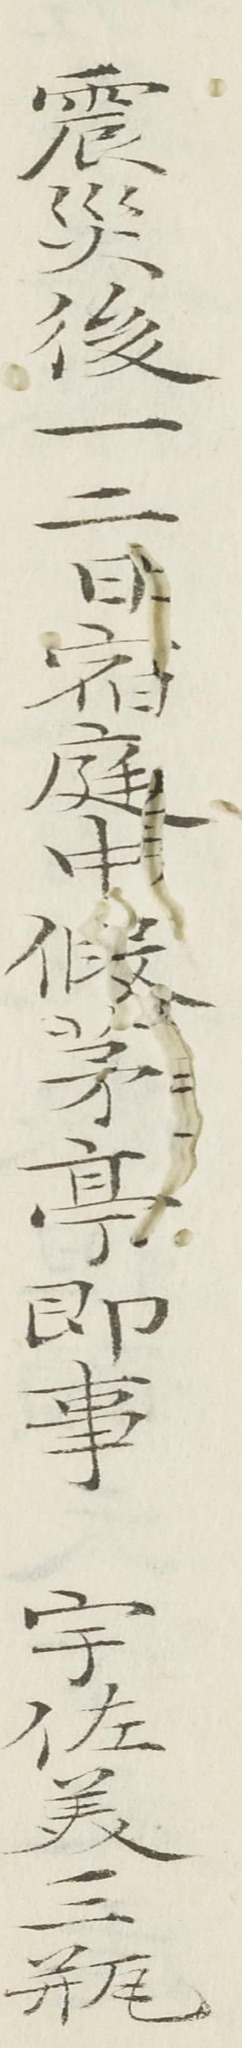震災後一二日宿庭中仮茅亭即時宇佐美三瓶
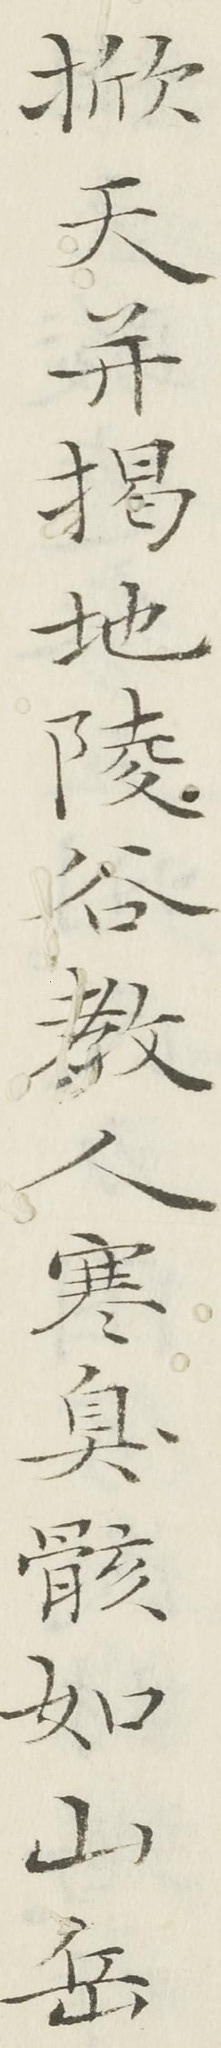掀天并掲地陵谷教人寒臭骸如山岳
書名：地震考證　全
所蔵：東京大学地震研究所図書室 Earthquake Research Institute Library, The University of Tokyo, JAPAN
